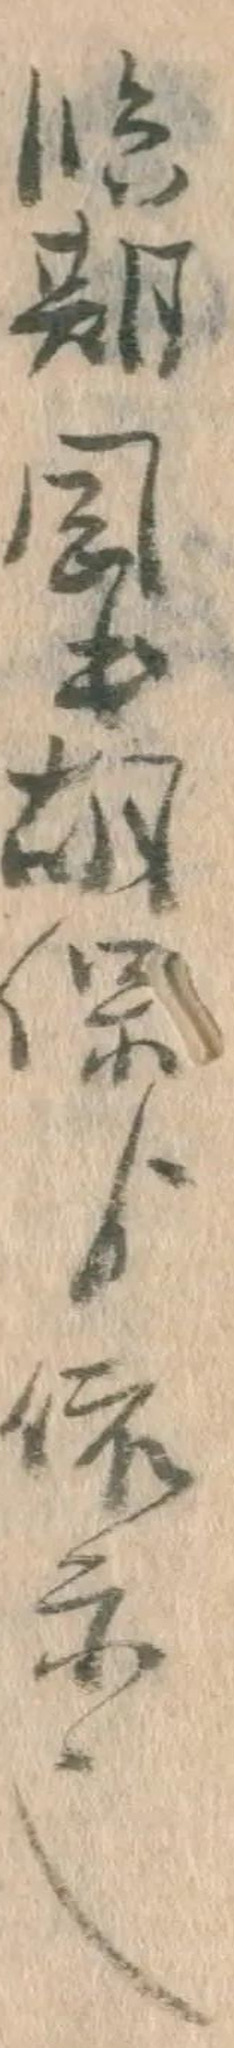臨期岡本胡保ゟ仰示也、
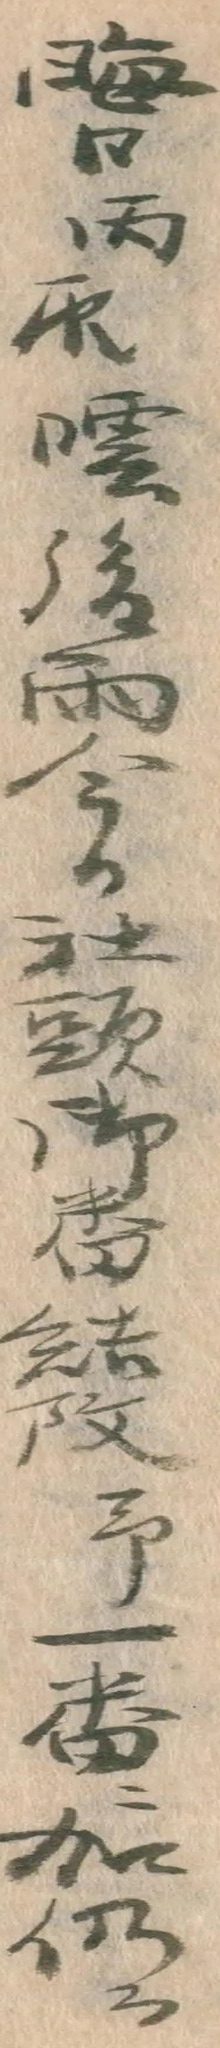晦日丙戌晴後雨、今日社頭御番結改、予一番ニ加、仍而
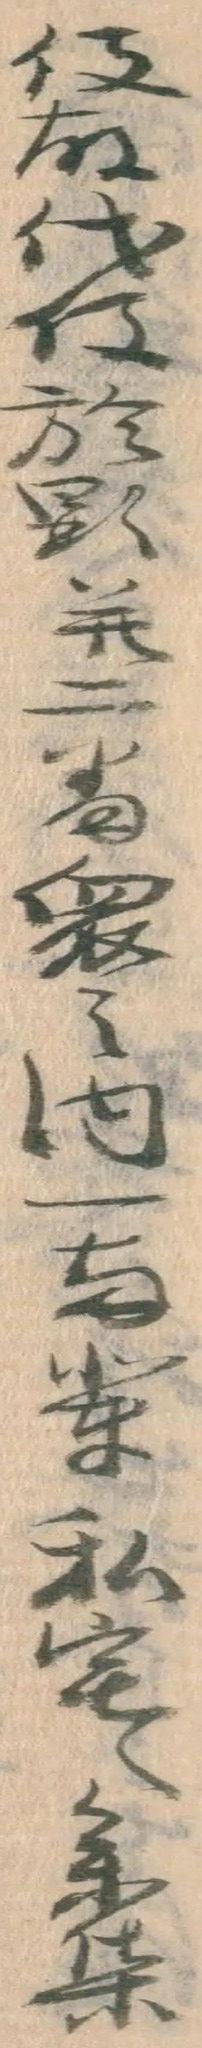役故、代役於顕并二番衆之内一両輩私宅へ参集、
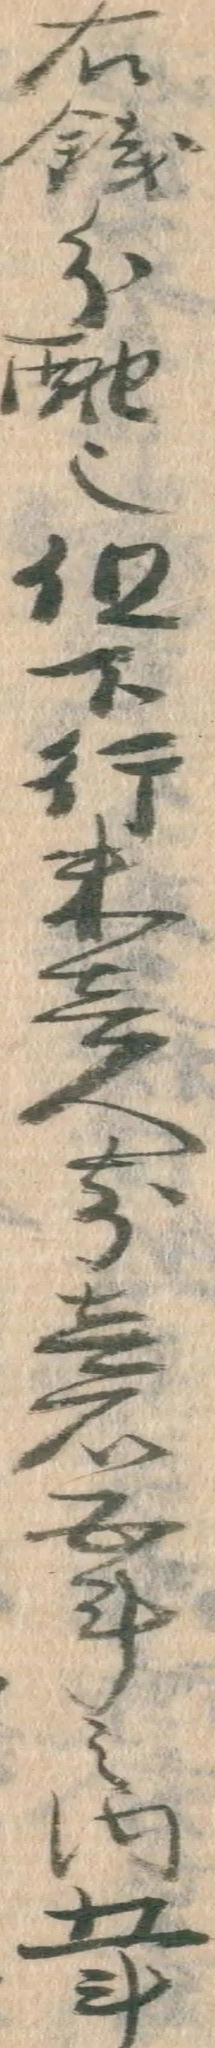右銭分配也、但下行米壱人前壱石五斗之内、五斗
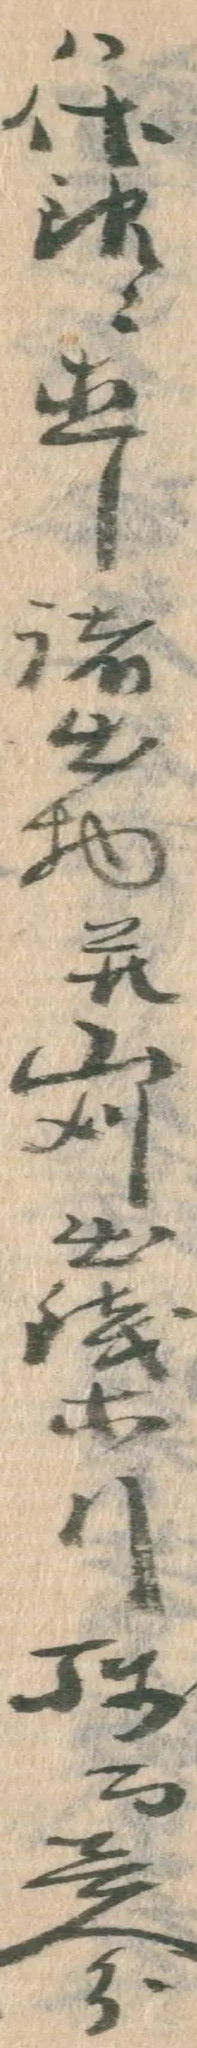ハ代銀二直し、諸出物并山刈出銭等引、残而壱人分
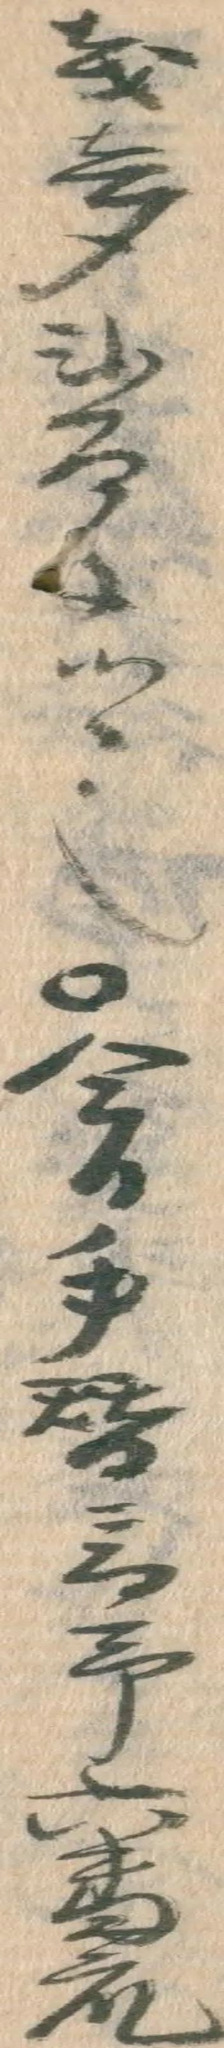銭壱〆弐百匁ツヽ也○今日手替ニ而、予六番衆
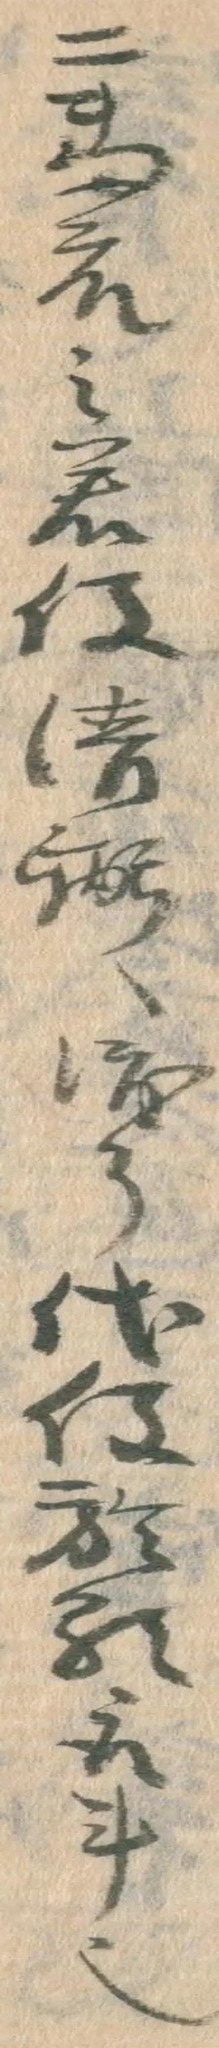二番衆之若役清弼へ渡了、代役於顕取計也、
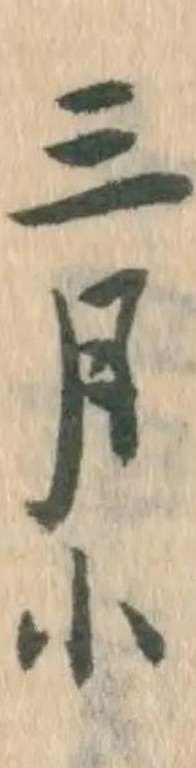三月小
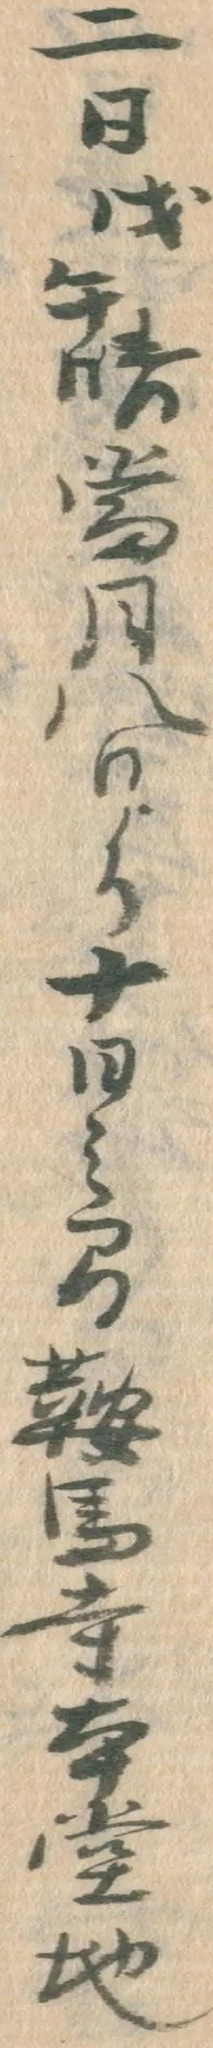二日戊午晴、當月八日より十日之間、鞍馬寺本堂地
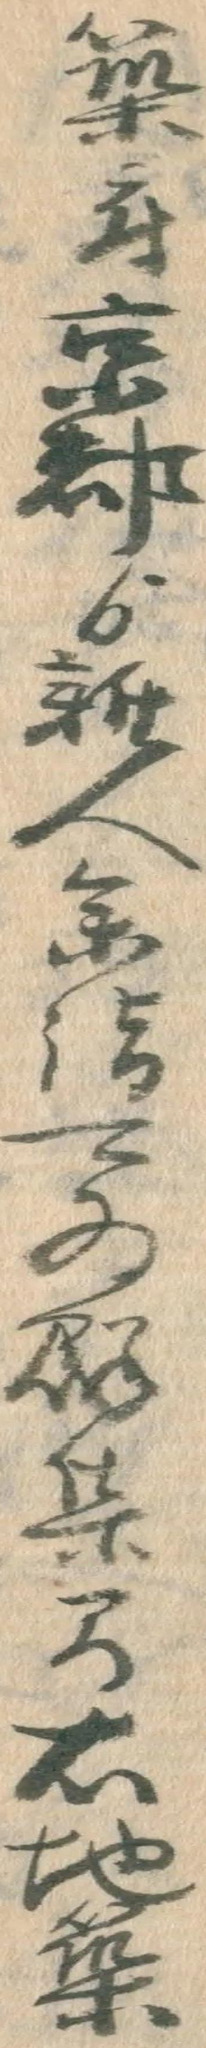築ニ付、京都ゟ雑人参詣可為群集間、右地築
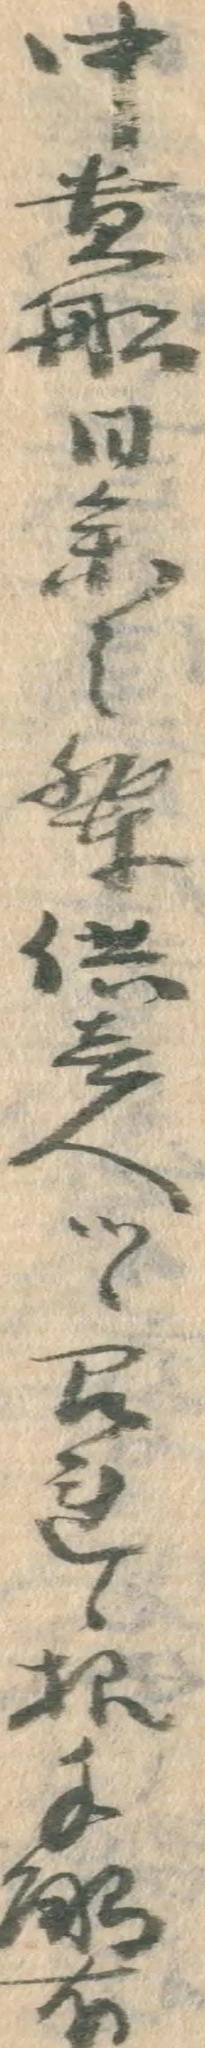中貴舩日参之輩、供壱人ツヽ召連候様手触有
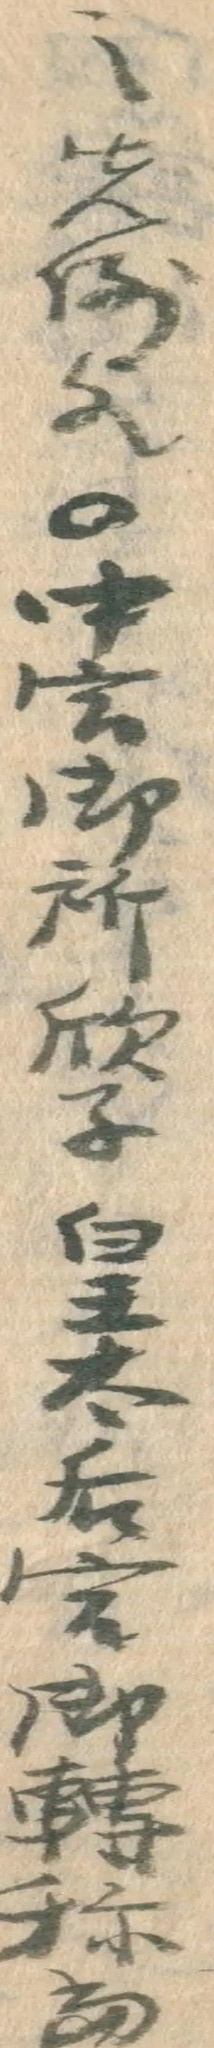之、先例歟、○中宮御所欣子皇太后宮御轉称、當
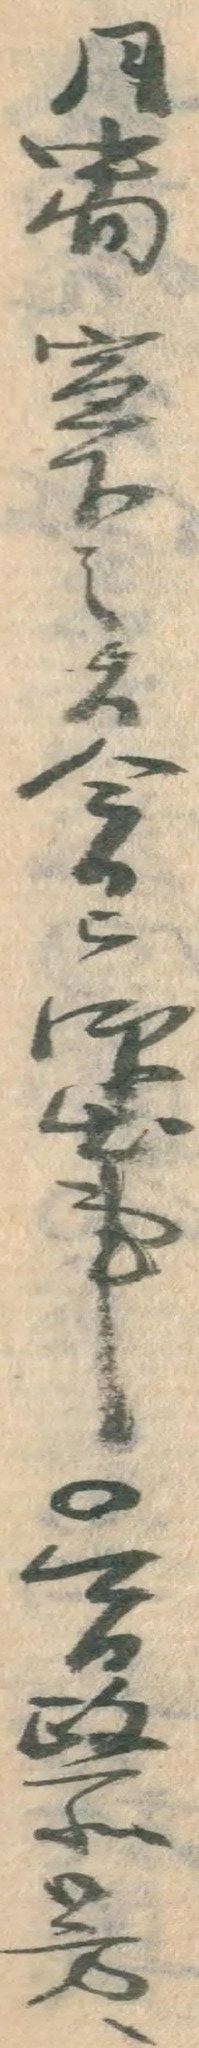月中旬宣下之旨、今日被仰出事、〇今日政所御方へ

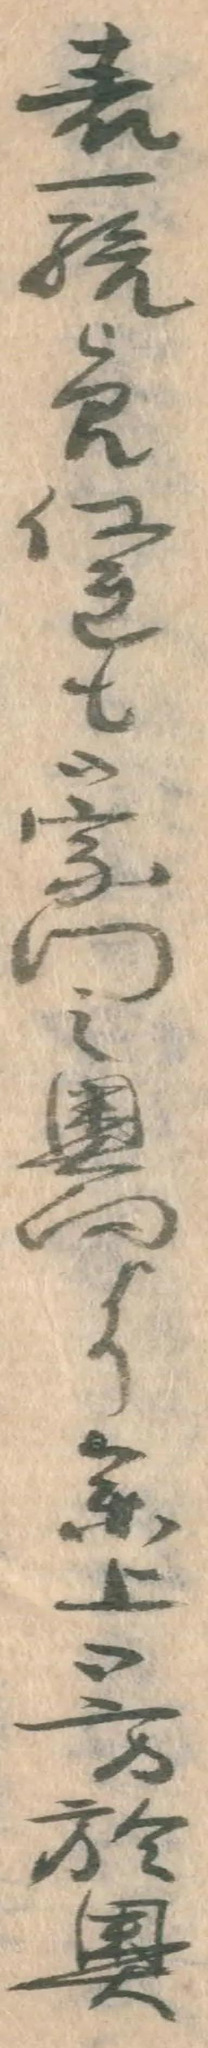表一統被見仕れも、御家門之奥向より参上御方於奥
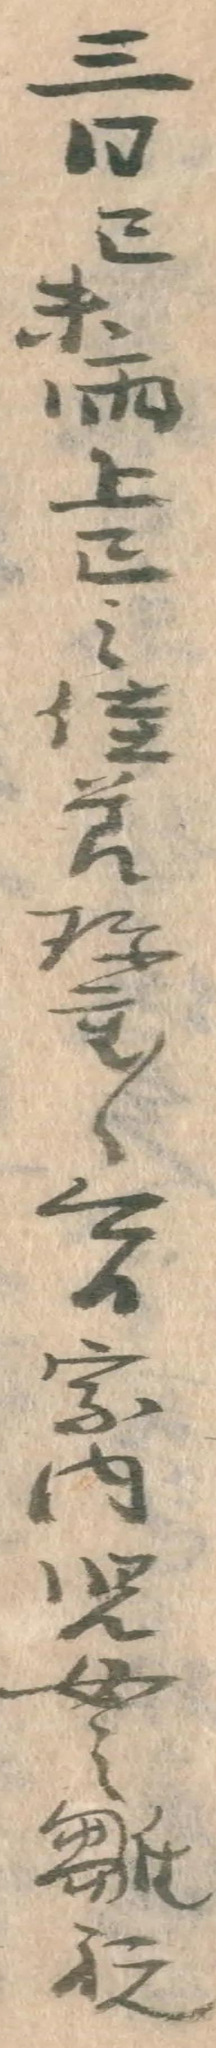三日己未雨、上巳之佳節珎重〳〵、今日家内児女之雛、祝
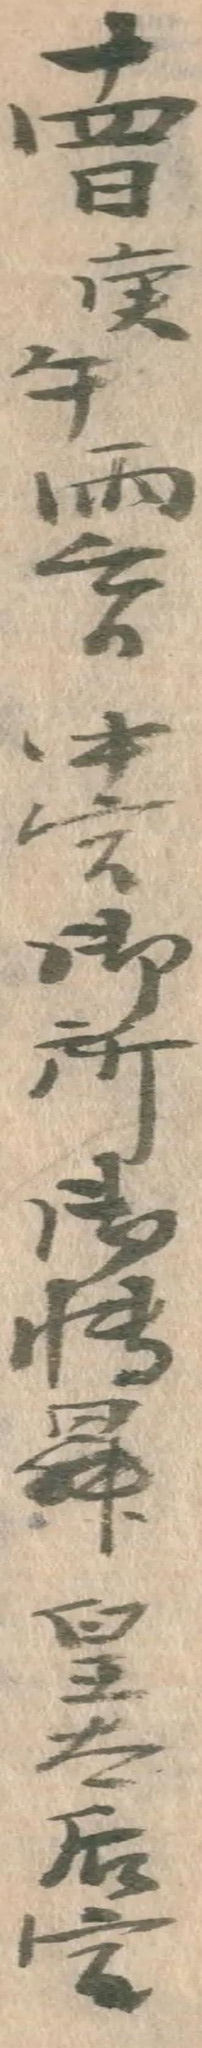十四日庚午雨、今日中宮御所御転昇、皇太后宮
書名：賀茂社記録. 第63冊
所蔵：国立国会図書館 National Diet Library, JAPAN
